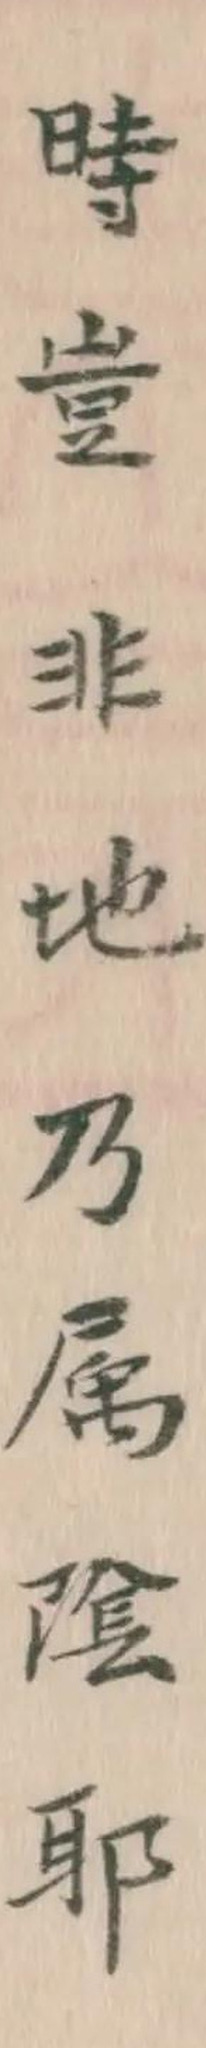時豈非地乃属陰耶
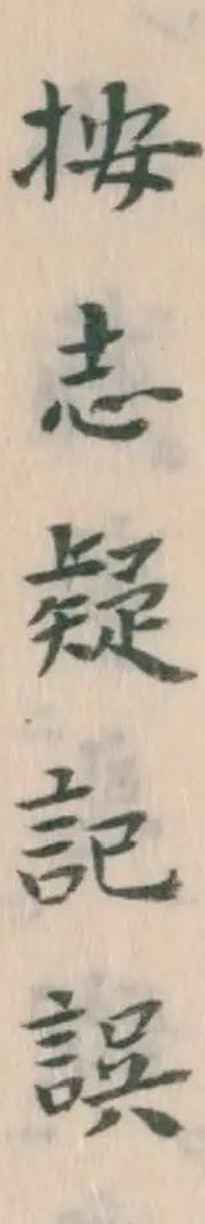按志疑記誤

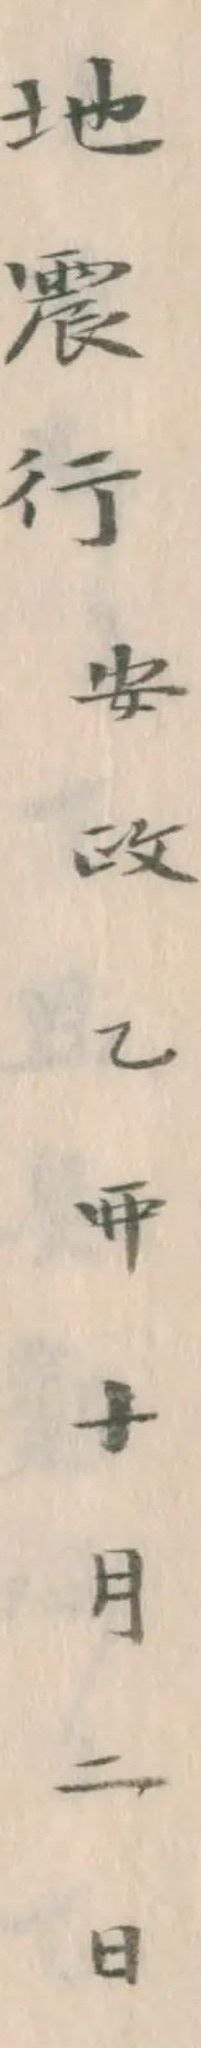地震行安政乙卯十月二日
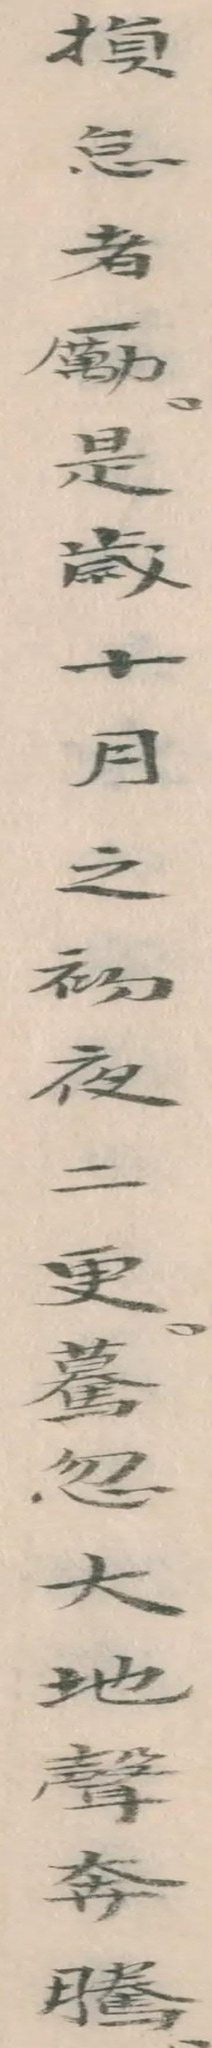損怠者勵。是歳十月之初夜二更驀忽大地聲奔騰。
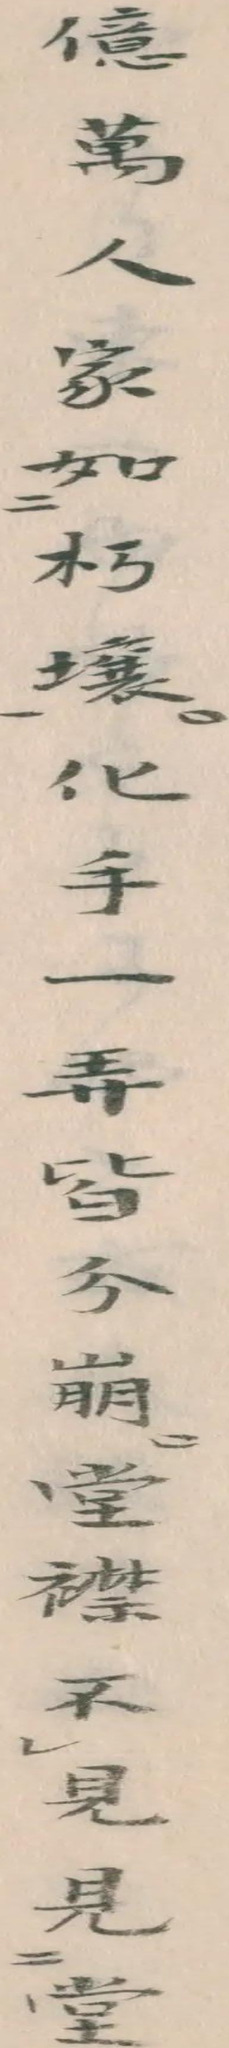億萬人家如朽壌。化手一弄皆分崩。堂襟不見見堂
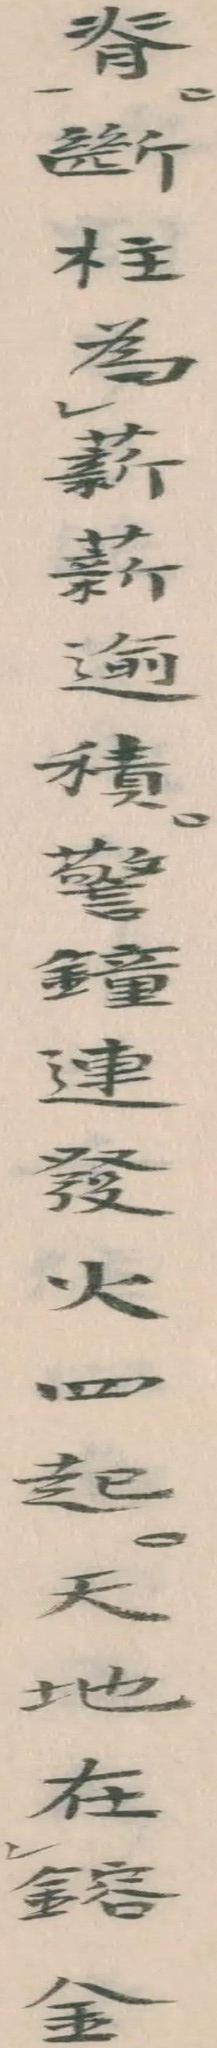背。斷柱為薪薪逾積。警鐘連發火四起。天地在鎔金
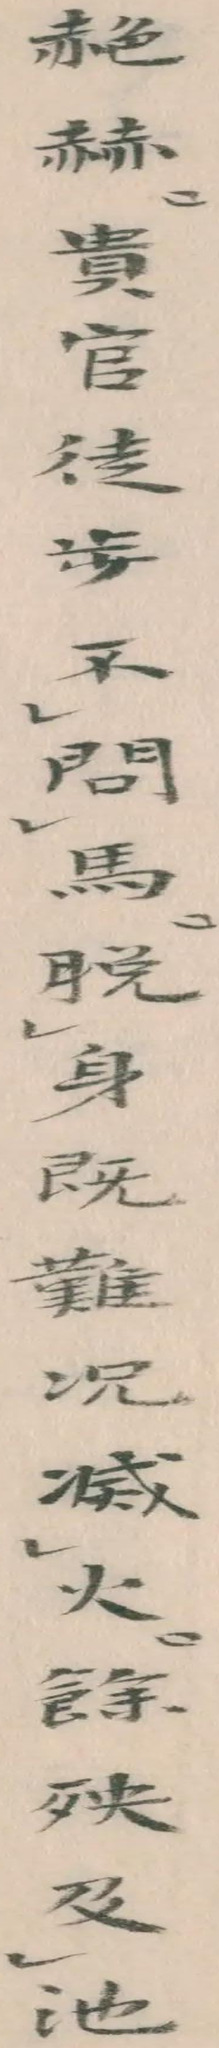赩赫。貴官徒歩不問馬。脱身既難况滅火。餘殃及池
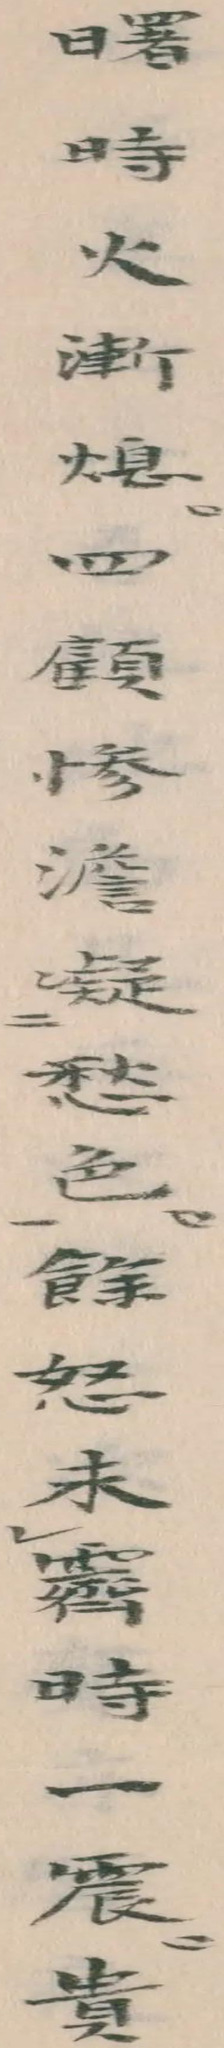曙時火漸熄。四顧惨澹凝愁色。餘怒未霽時一震。貴
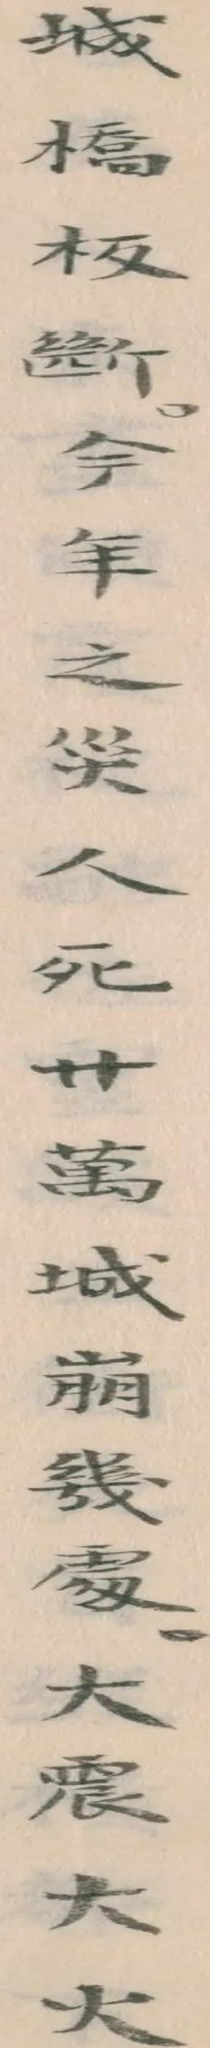城橋板斷。今年之災人死卄萬城崩幾䖏。大震大火
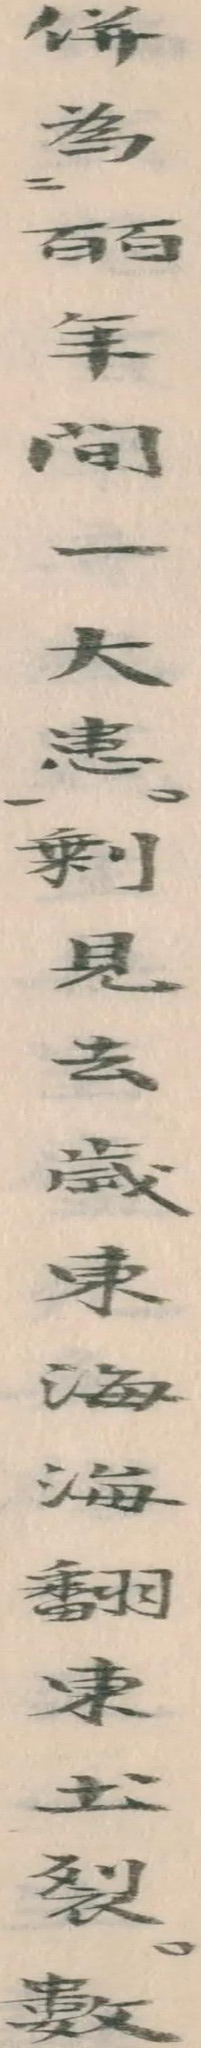併為皕年間一大患。剰見去歳東海海翻東土裂。數
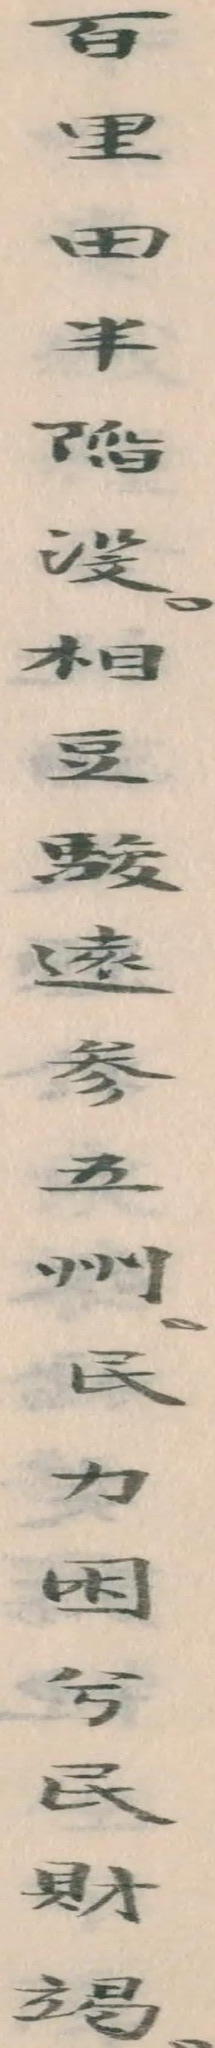百里田半陥没。相豆駿遠参五州。民力困兮民財竭。

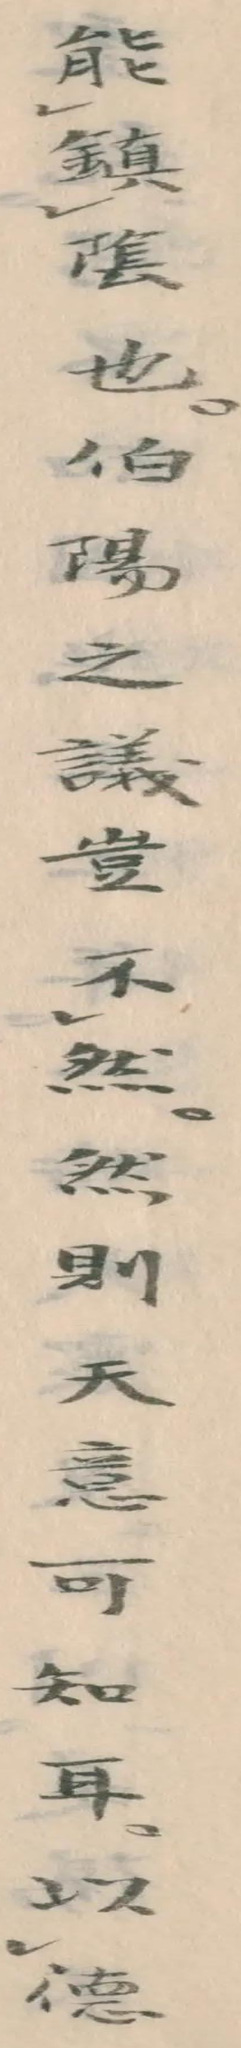能鎭陰也。伯陽之議豈不然。然則天意可知耳。以德
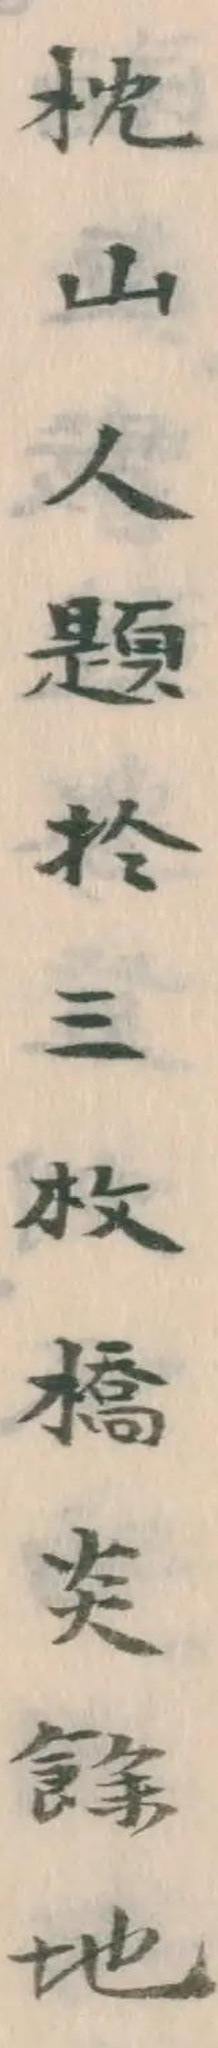枕山人題扵三枚橋炎餘地
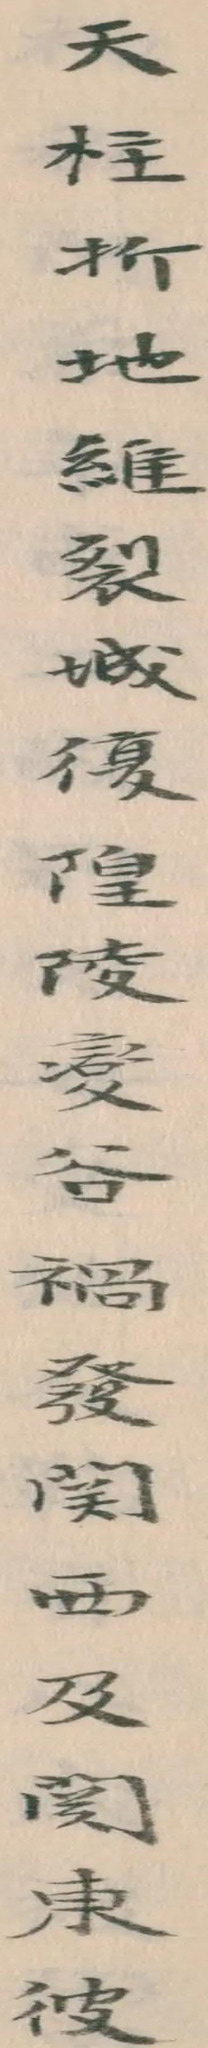天柱折地維裂城復隍陵變谷禍發関西及関東彼
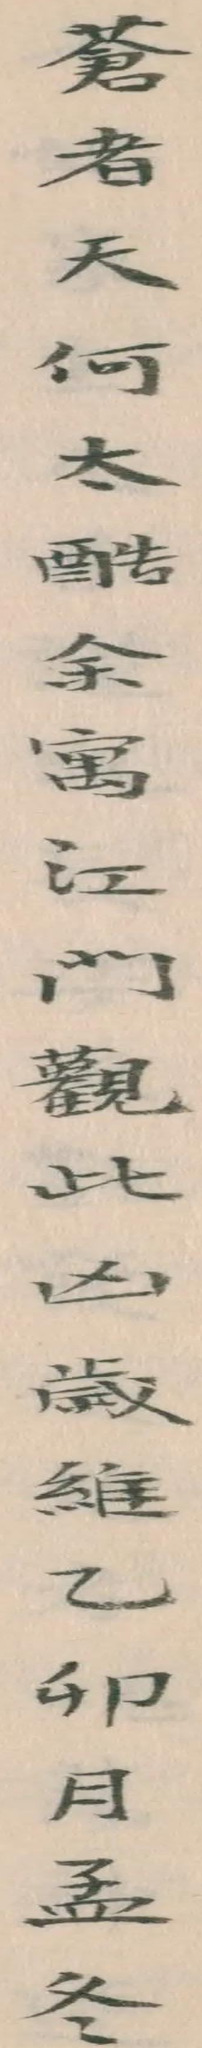蒼者天何太酷余寓江門觀此凶歳維乙卯月孟冬
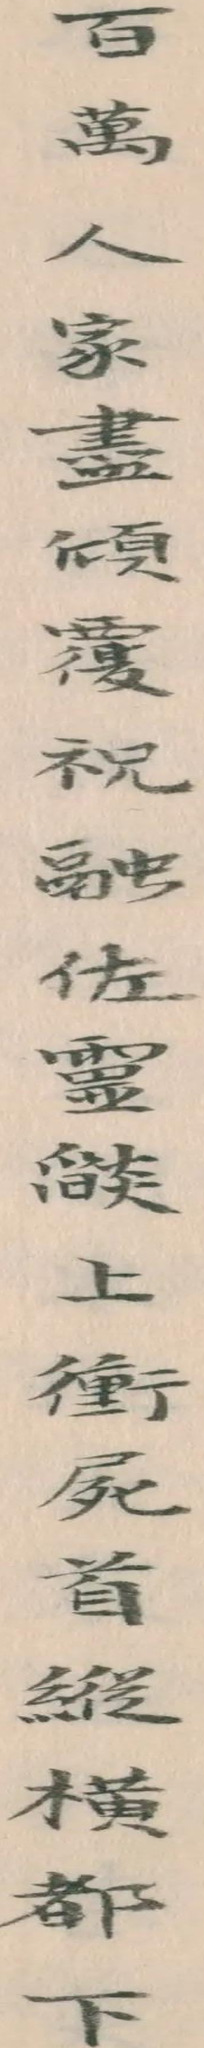百萬人家盡傾覆祝融佐霊燄上衝屍首縦横都下
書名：地災撮要. 巻11-12(地震之部)
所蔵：国立国会図書館 National Diet Library, JAPAN
